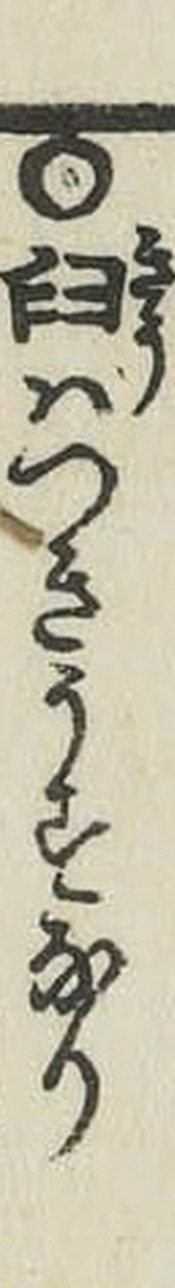○臼はつきうすなり
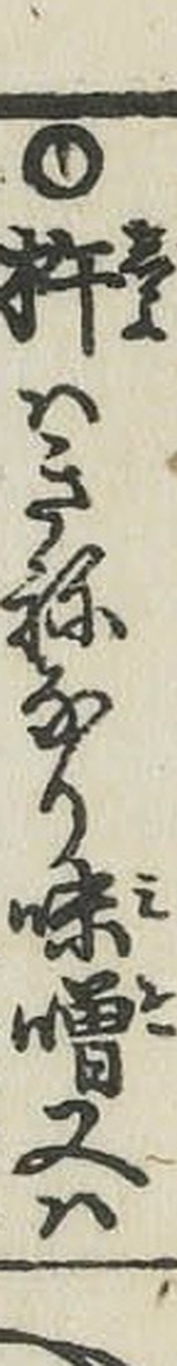○杵はきねなり味噌又は
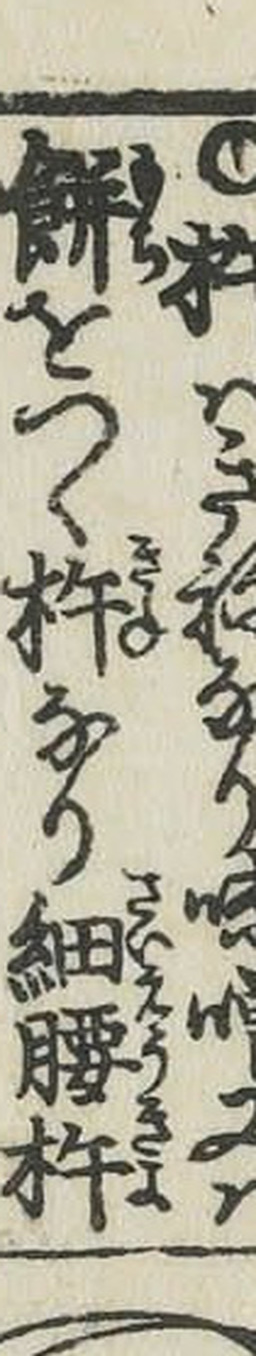餅をつく杵なり細腰杵
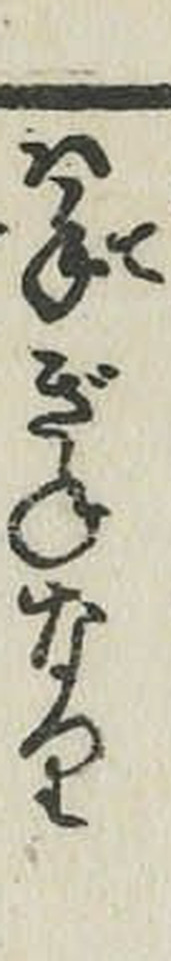は手ぎねなり
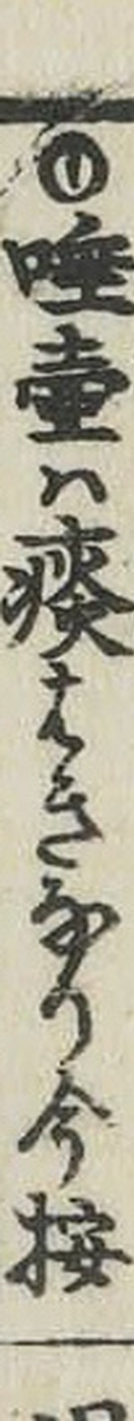○唾壺は痰はきなり今按

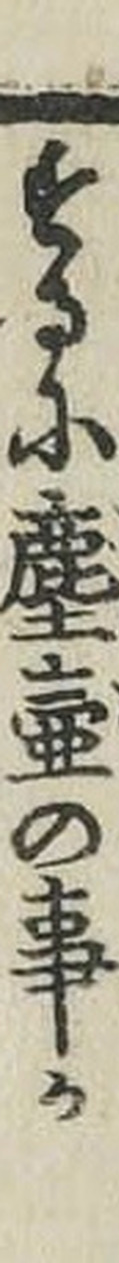するに塵壺の事か
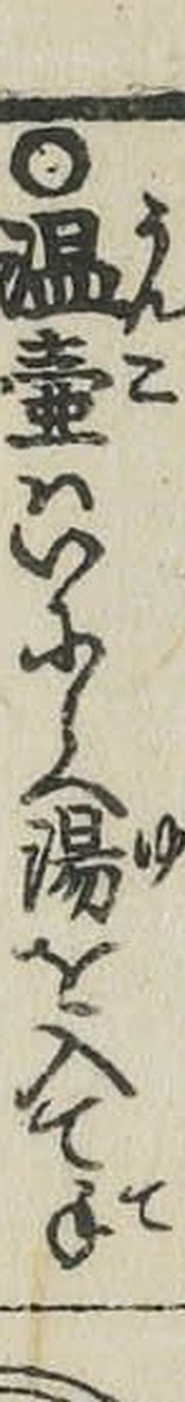○温壺はいにしへ湯を入て手
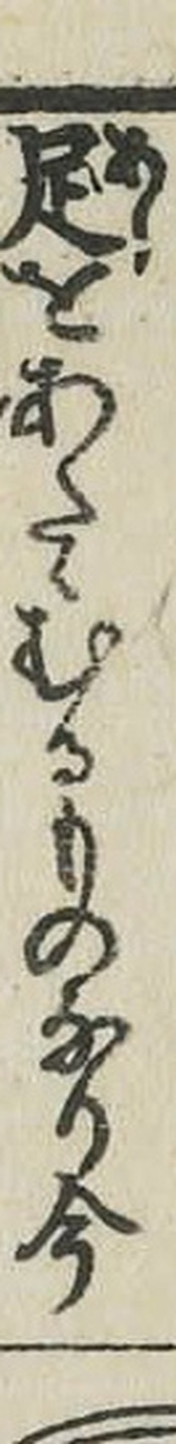足をあたゝむるものなり今
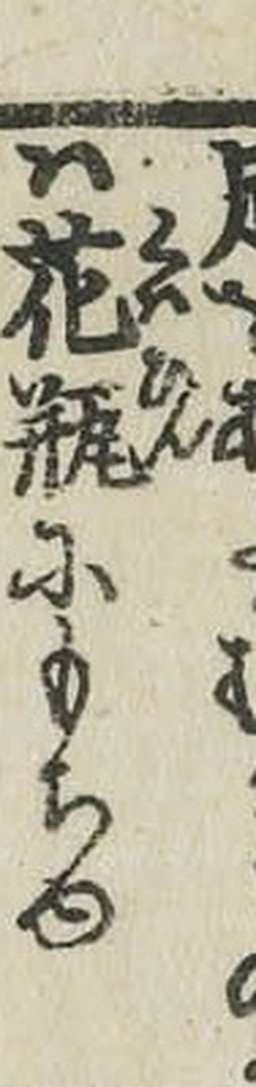は花瓶にもちゆ
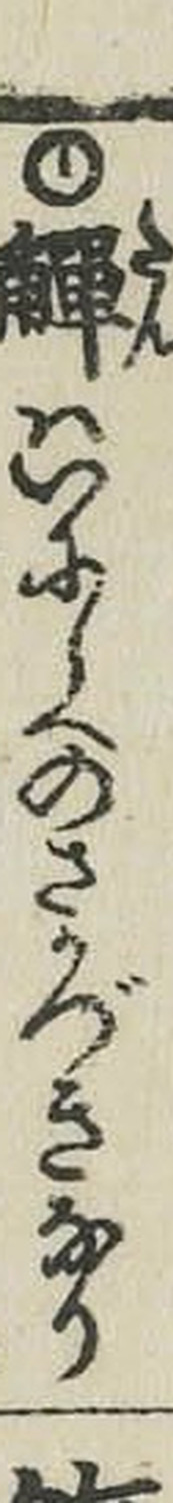○觶はいにしへのさかづきなり
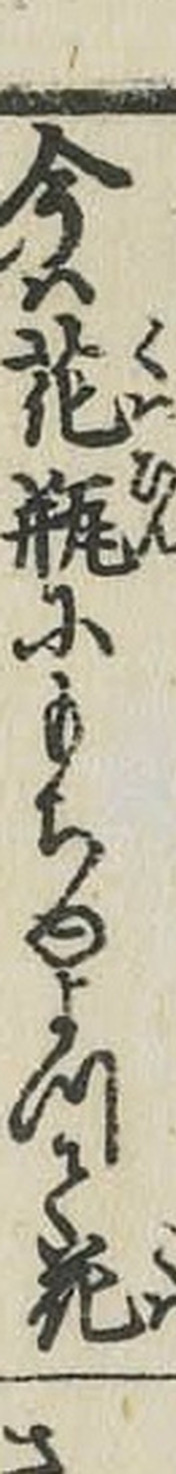今は花瓶にもちゆよつて花
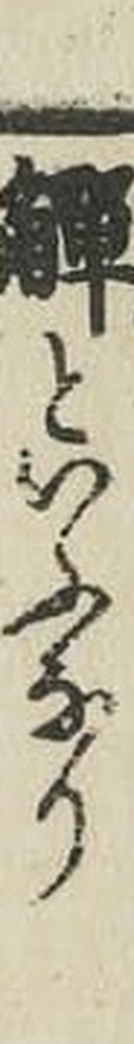觶といふなり
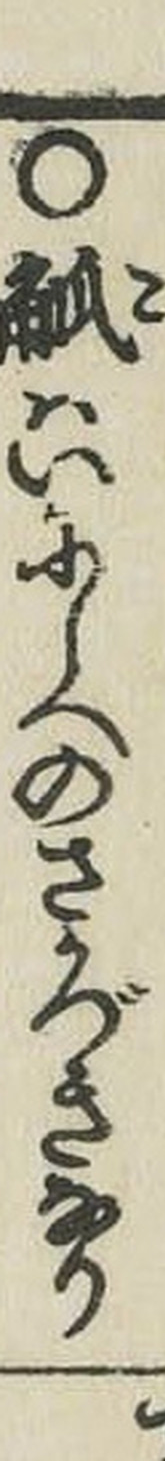○觚はいにしへのさかづきなり
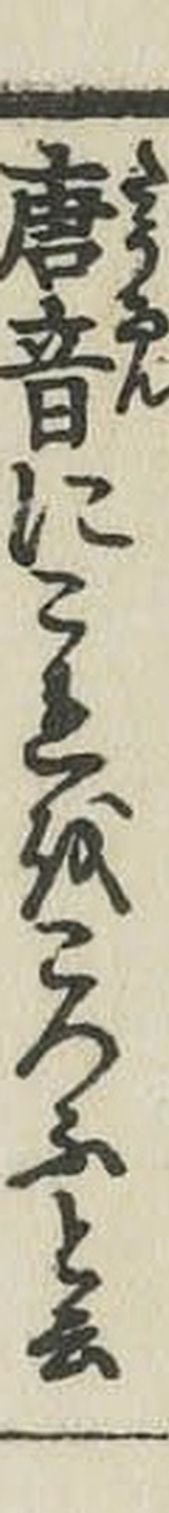唐音にこれをこつふと云
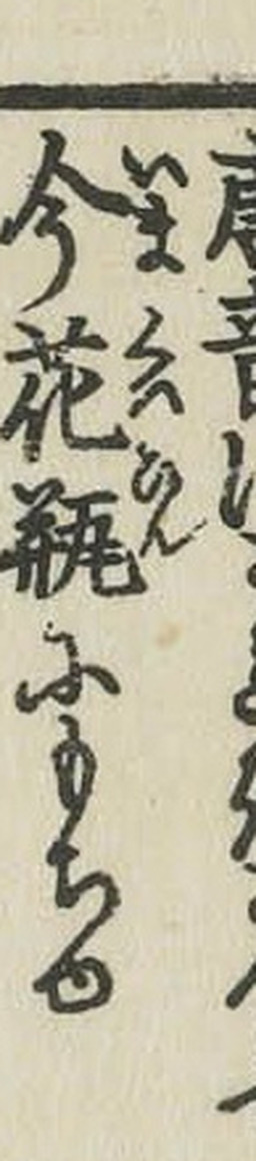今花瓶にもちゆ
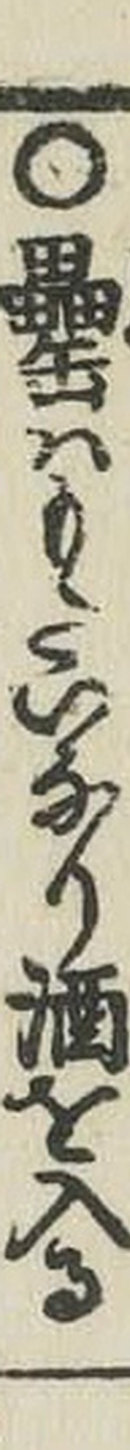○罍はもたいなり酒を入る
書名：増補頭書訓蒙図彙大成 10巻 5:巻之9-11
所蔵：東京学芸大学教育コンテンツアーカイブ
